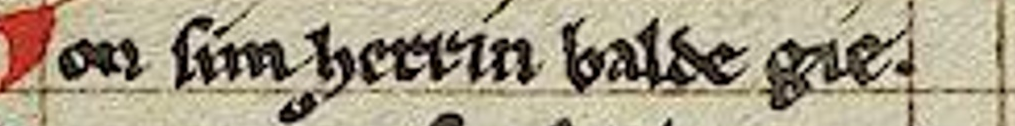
*Von ſim herrin balde gie.
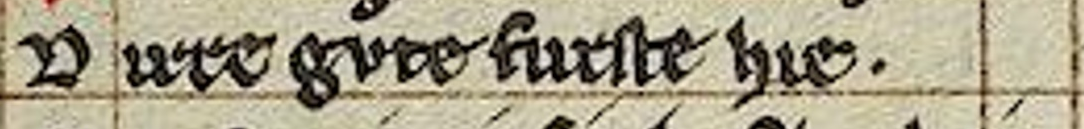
Dirre gv°ote furſte hie.
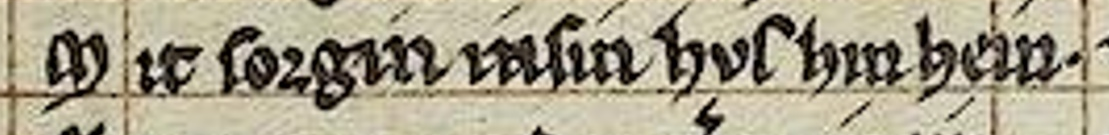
Mit ſorgin inſin hvſ hin hein.
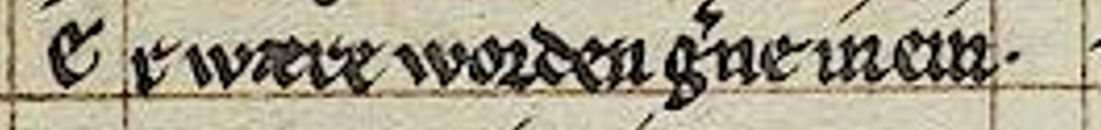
Er w[ae]re worden g(er)ne in ein.
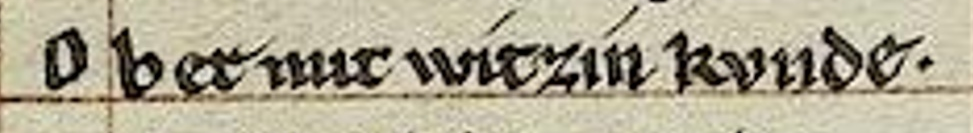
Ob er mit witzin kvnde.
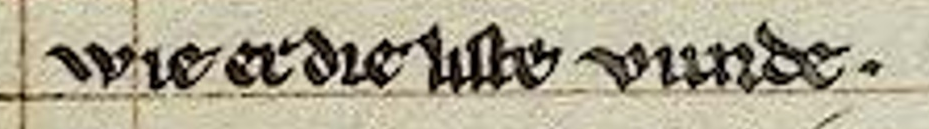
Wie er die liſte vunde.
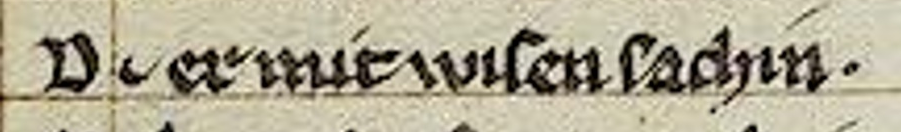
D(az) er mit wiſen ſachin.
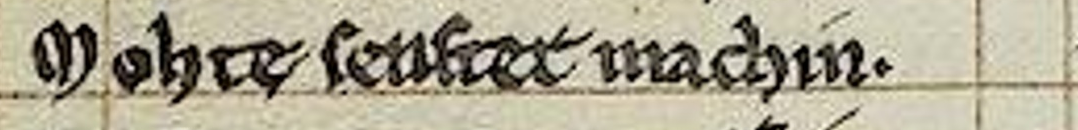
Mohte ſenfter machin.
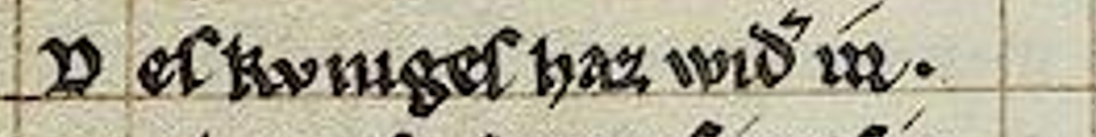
Deſ kvnigeſ haz wid(er) in.
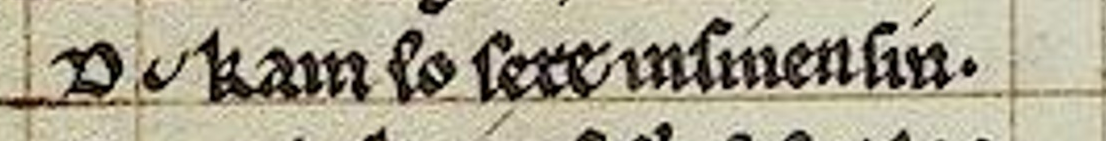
D(az) kam ſo ſere inſinen ſin.
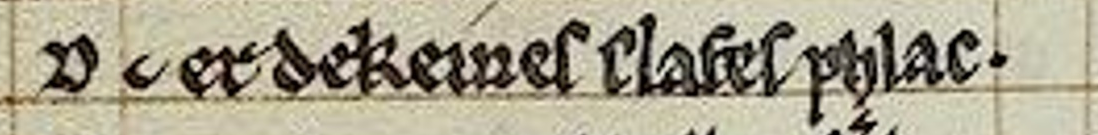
D(az) er dekeineſ ſlafeſ phlac.
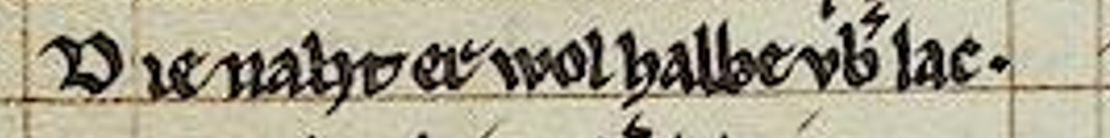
Die naht er wol halbe vb(er) lac.
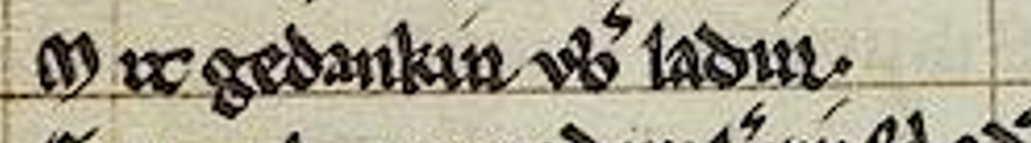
Mit gedankin vb(er) ladin.
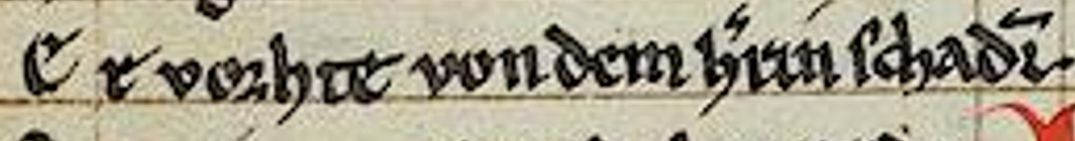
Er vorhte von dem h(er)rin ſchadi(n).
